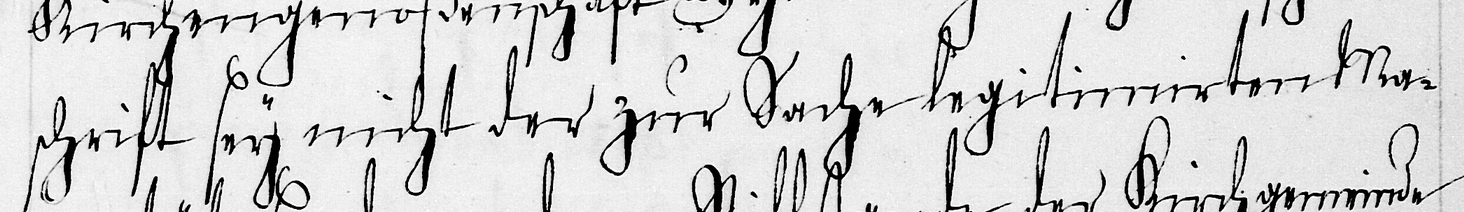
schrift sey nicht der zur Sache legitimirten Ma¬
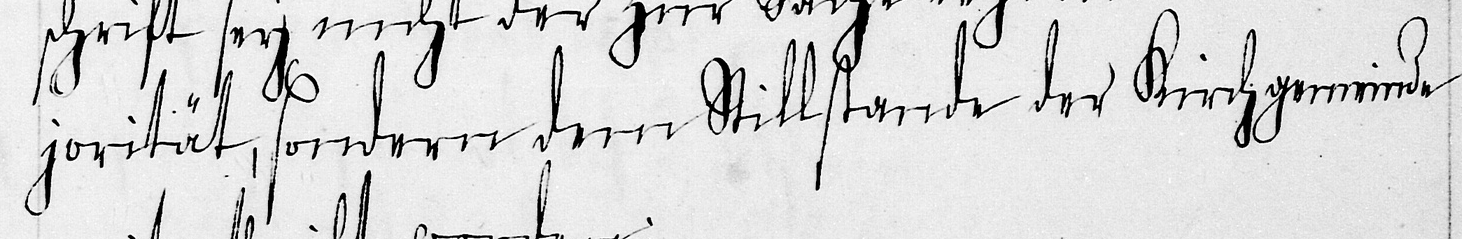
jorität, sondern dem Stillstande der Kirchgemeinde
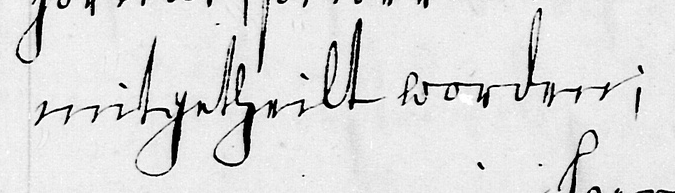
mitgetheilt worden;
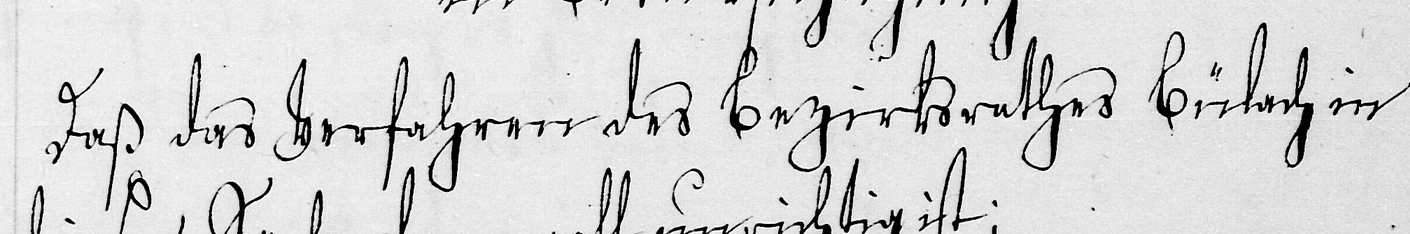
Daß das Verfahren des Bezirksrathes Bülach in
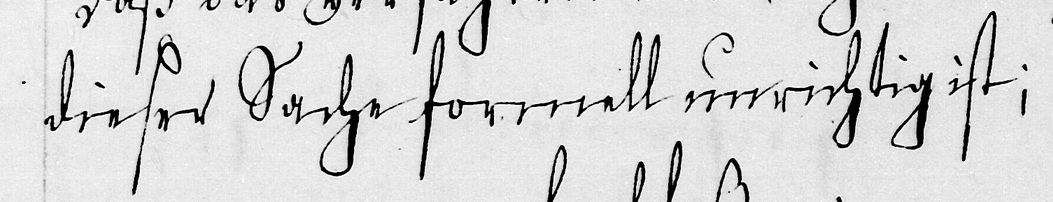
dieser Sache formell unrichtig ist;
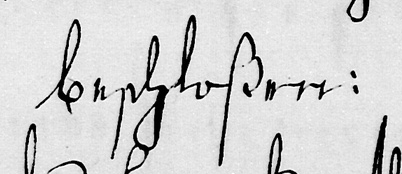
beschloßen:
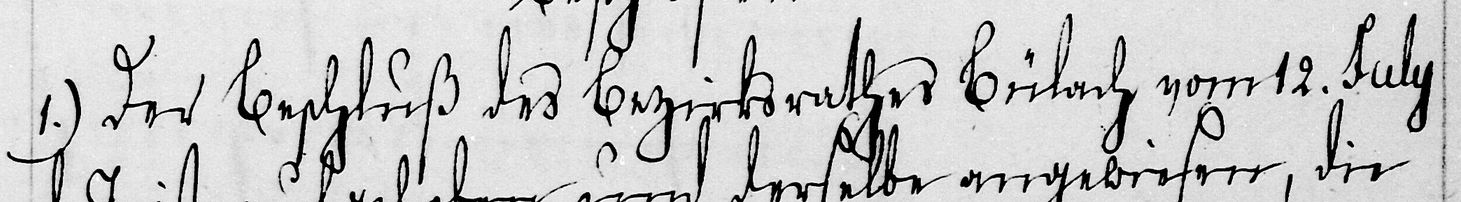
1.) Der Beschluß des Bezirksrathes Bülach, vom 12. July
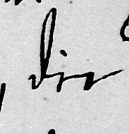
die
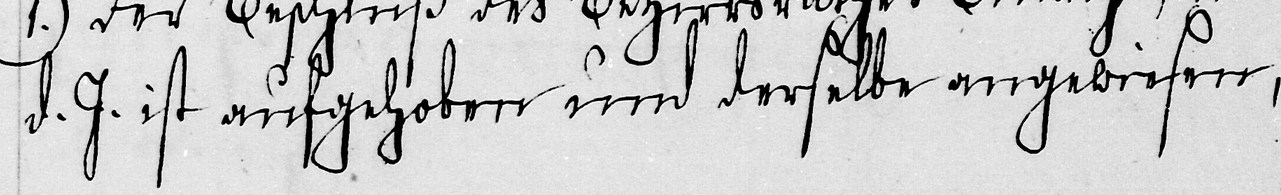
d. J. ist aufgehoben und derselbe angewiesen,
